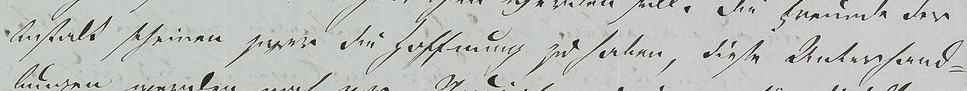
Anstalt scheinen zwar die Hoffnung zu haben, diese Unterhand-
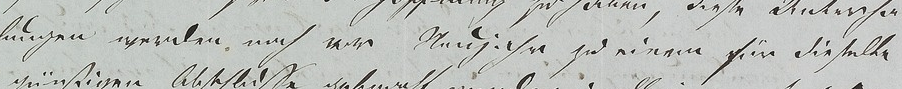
lungen werden noch vor Neujahr zu einem für dieselbe
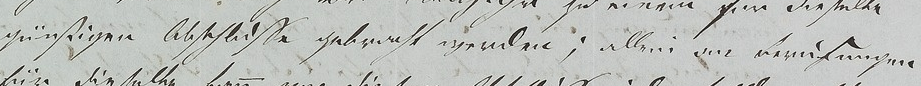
günstigen Abschlusse gebracht werden; allein an Berufungen
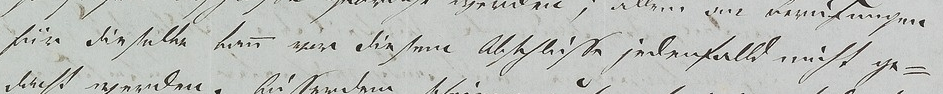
für dieselbe kann vor diesem Abschlusse jedenfalls nicht ge-
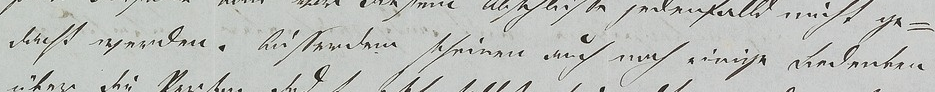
dacht werden. Ausserdem scheinen auch noch einige Bedenken
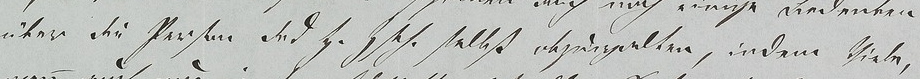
über die Person des H. Zsch. selbst obzuwalten, indem Viele,
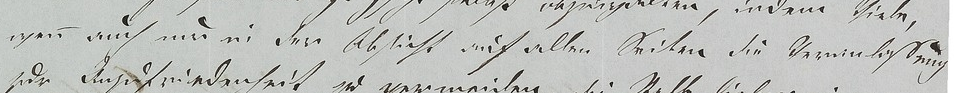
wenn auch nur in der Absicht auf allen Seiten die Veranlassung
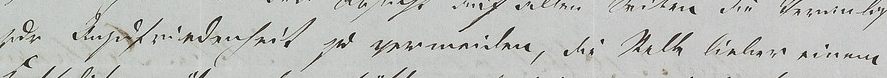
zur Unzufriedenheit zu vermeiden, die Stelle lieber einem
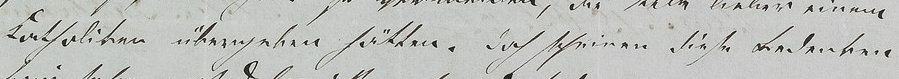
Katholiken übergeben hätten. Doch scheinen diese Bedenken
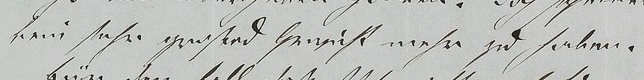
kein sehr großes Gewicht mehr zu haben.
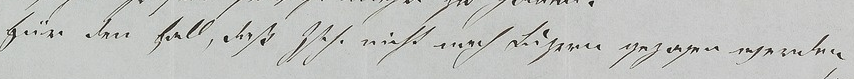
Für den Fall, daß Zsch. nicht nach Luzern gezogen werden
